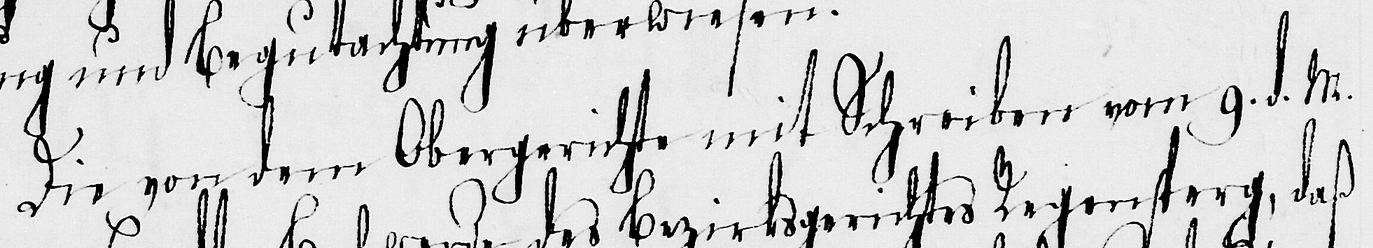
Die von dem Obergerichte mit Schreiben vom 9. d. M.
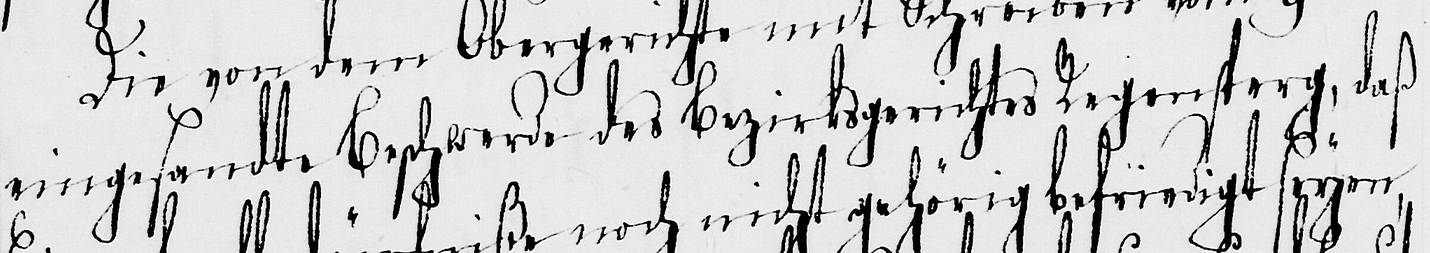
eingesandte Beschwerde des Bezirksgerichtes Regensperg,
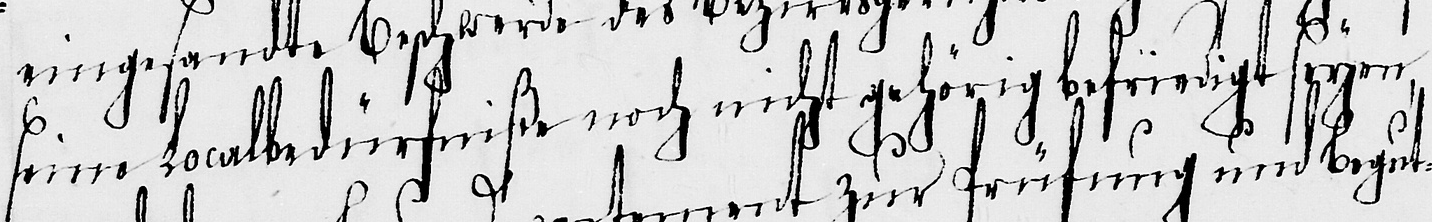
eine Localbedürfniße noch nicht gehörig befriedigt
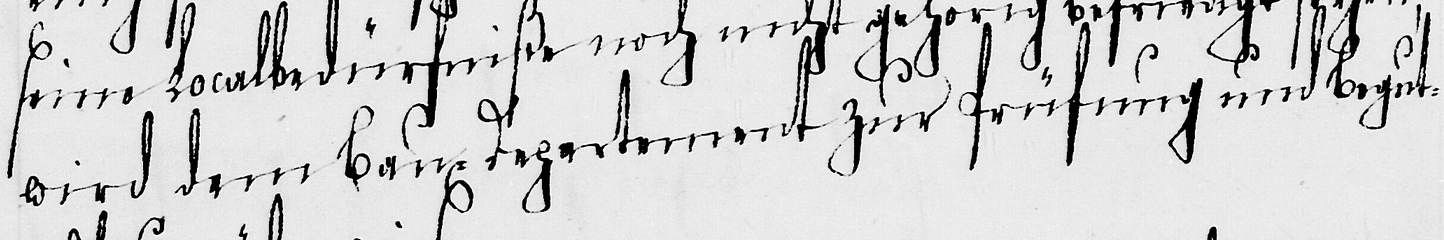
wird dem Bau-Departement zur Prüfung und Begut¬
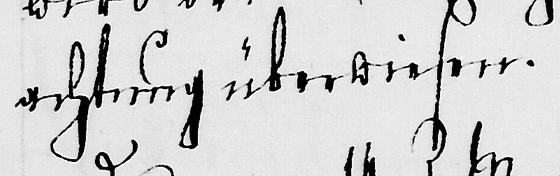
achtung überwiesen.
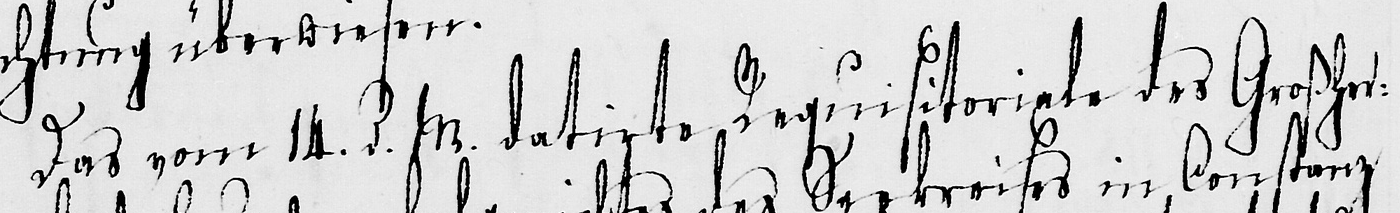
Das vom 14. d. M. datirte Requisitoriale des Großher¬
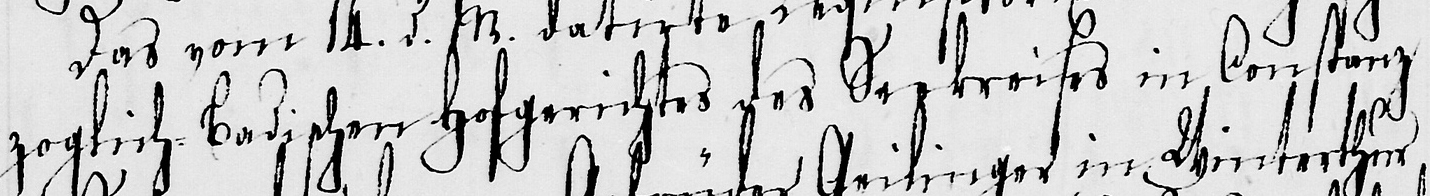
zoglich-Badischen Hofgerichtes des Seekreises in Constanz
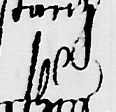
daß s¬
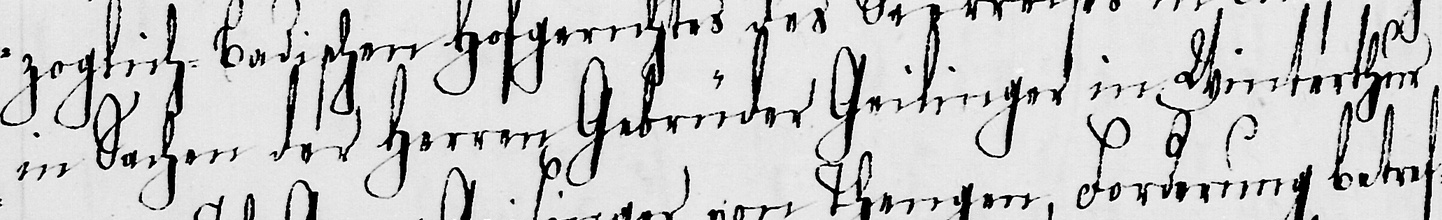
in Sachen der Herren Gebrüder Geilinger in Winterthur
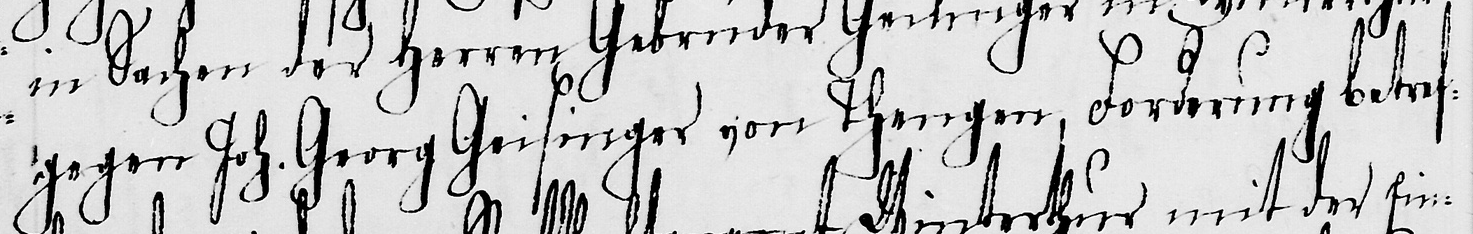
gegen Joh. Georg Geisinger von Thengen, Forderung betref¬
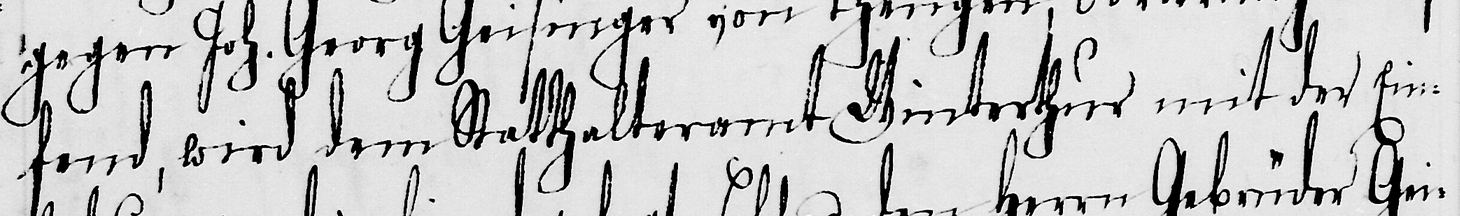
fend, wird dem Statthalteramt Winterthur mit der Ei¬
